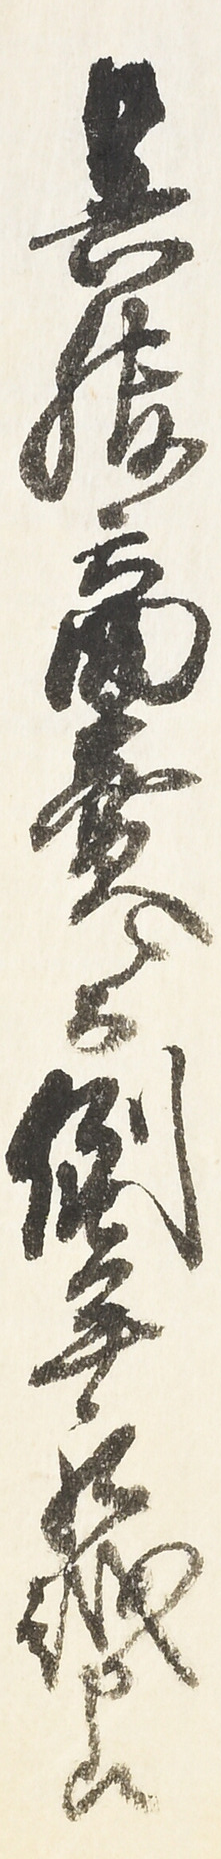呉服商売ニ而例年罷越申候
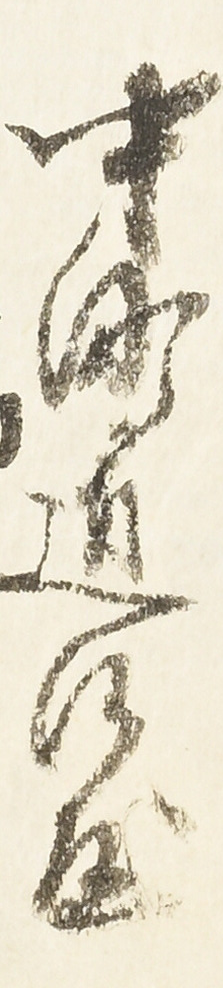中町近江屋
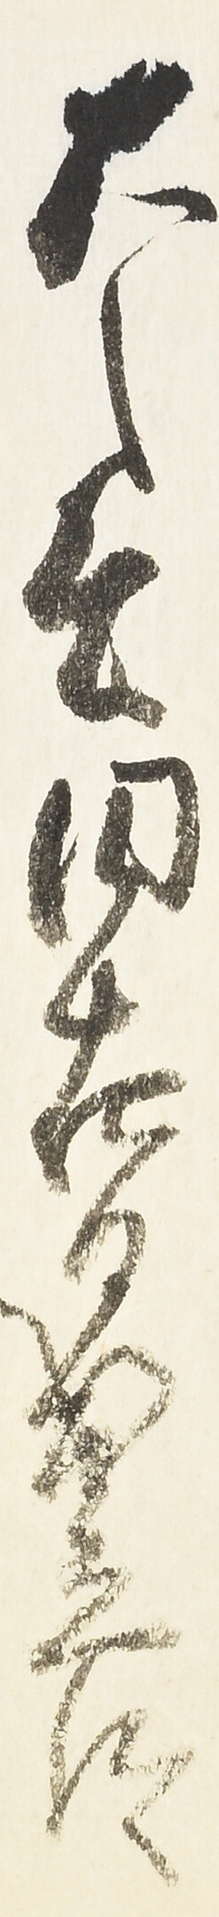右之者同八日出立仕候
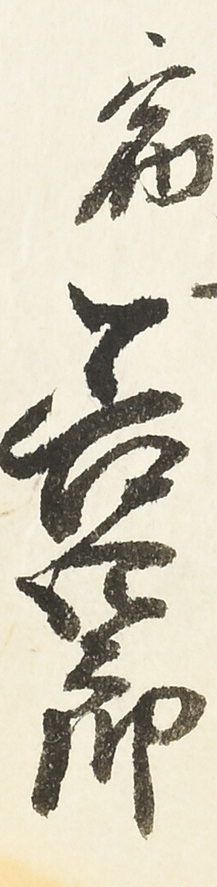宿善四郎
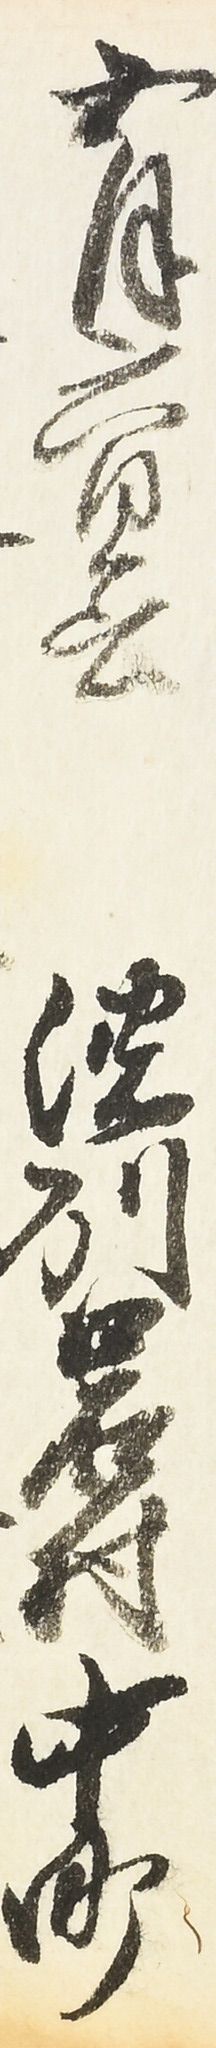五月六日着濃州岩村中町
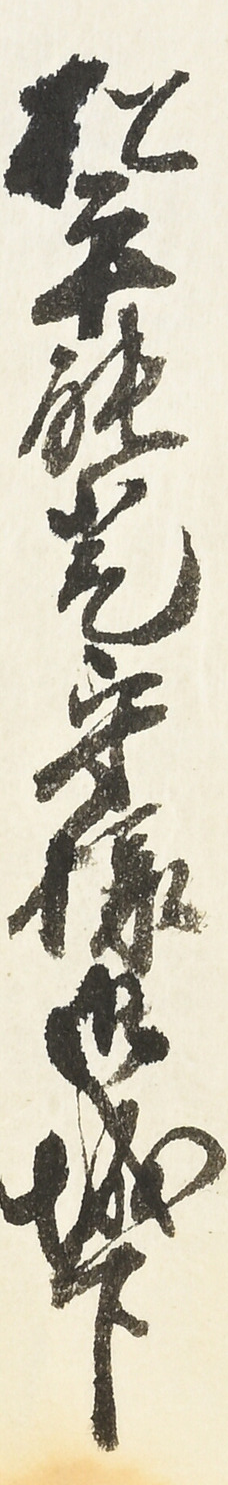松平能登守様御城下
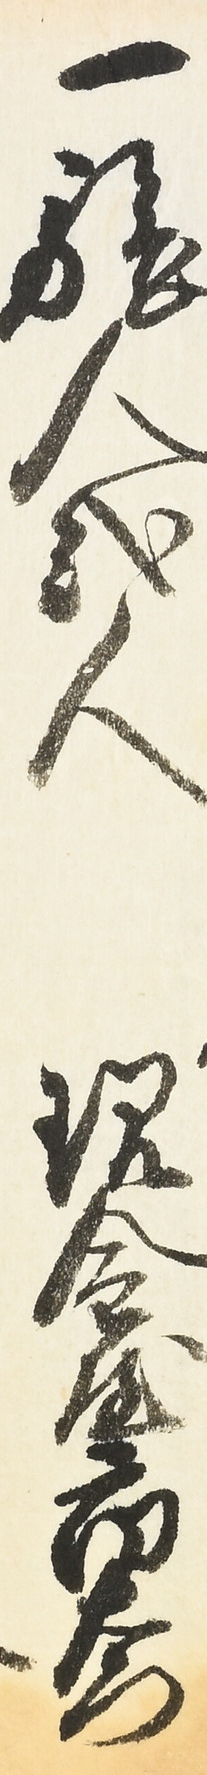一旅人弐人現金屋市右衛門
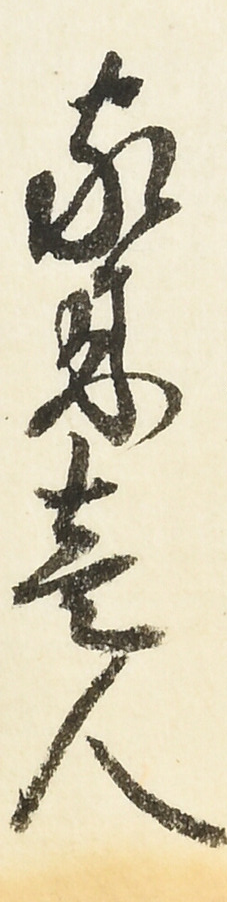家来壱人
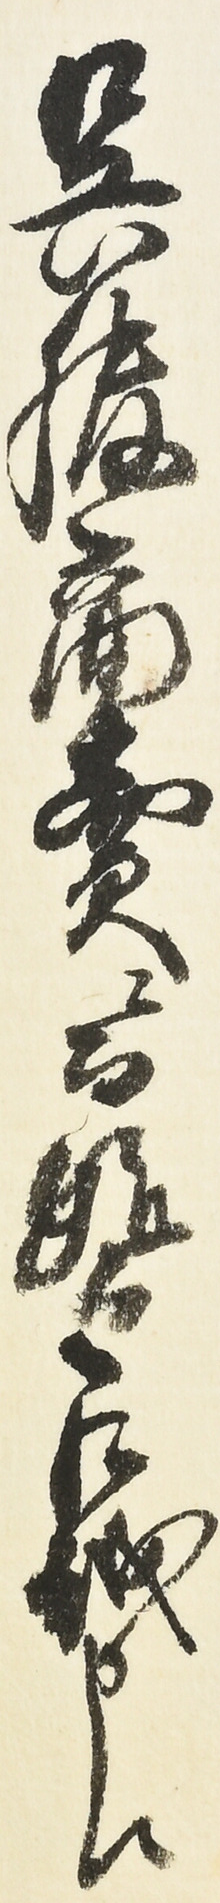呉服商売ニ而始而罷越申候
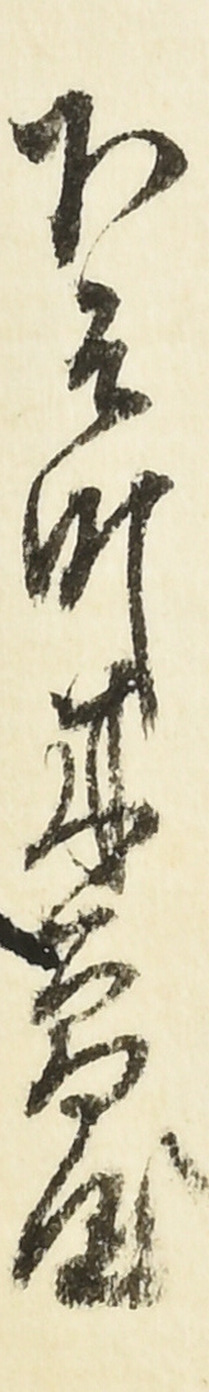下モ町木曽屋
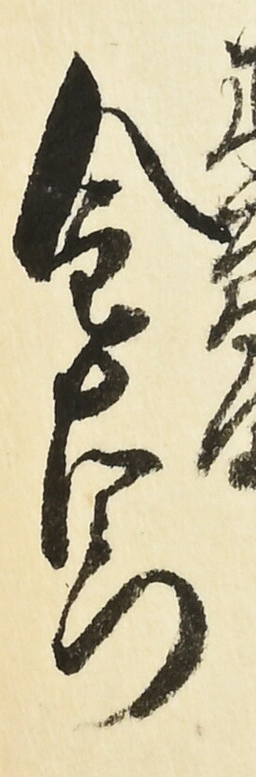金右衛門
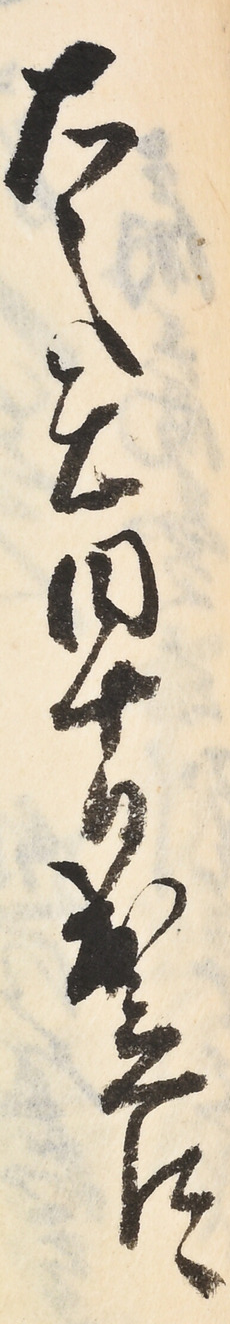右之者同十四日出立仕候

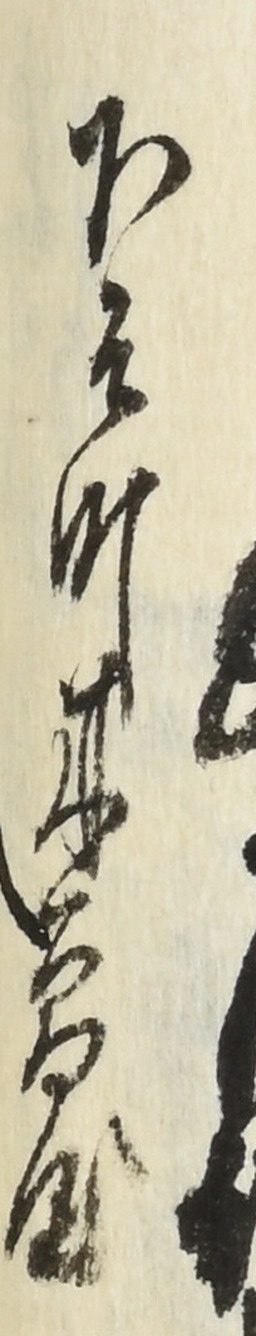下モ町木曽屋
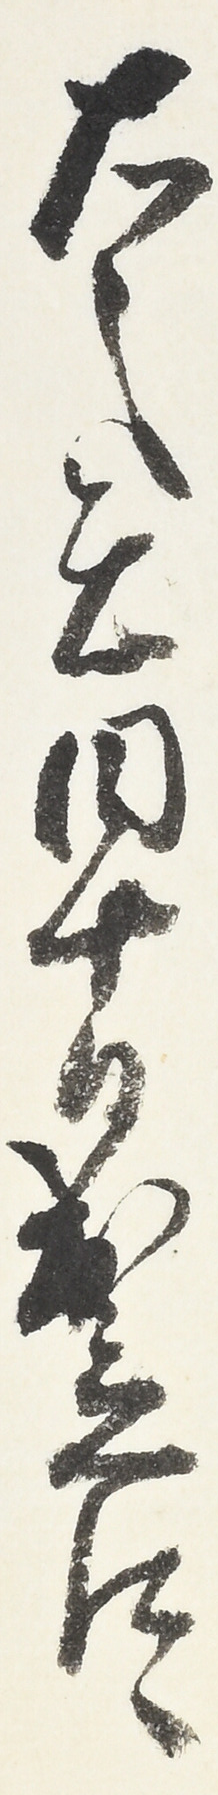右之者同十日出立仕候
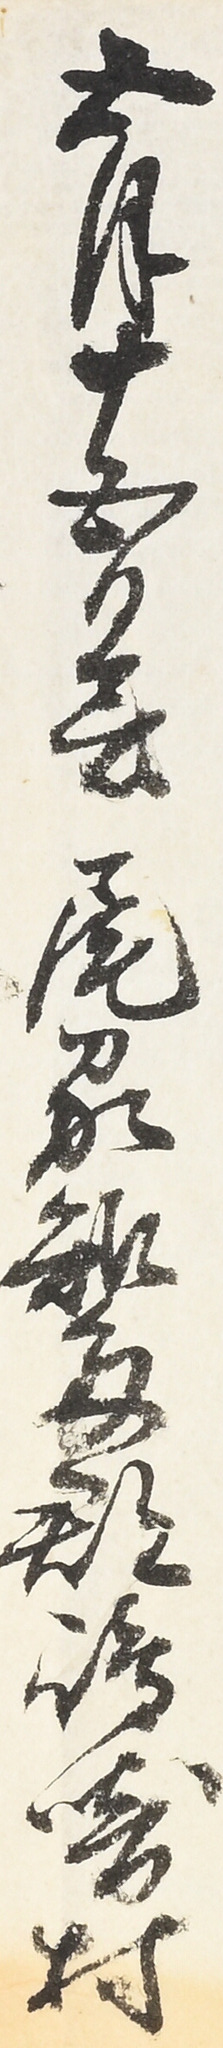五月十五日着尾州知多郡嶋崎村
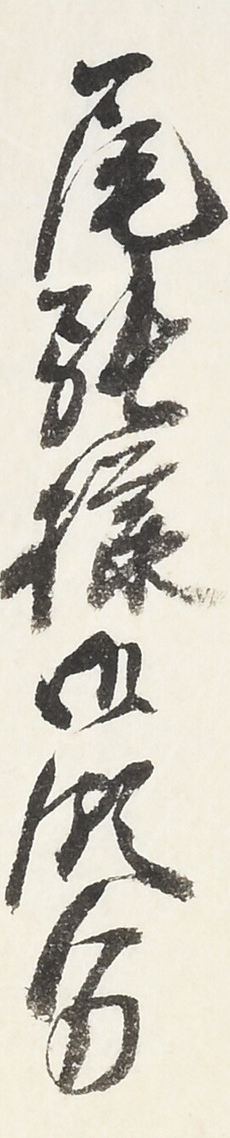尾張様御領分
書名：町中旅人泊控帳
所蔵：伊那市立高遠町図書館・合同会社AMANE
